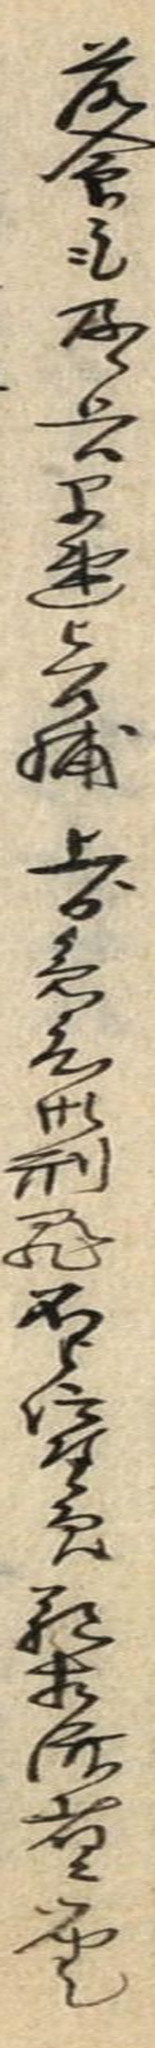落命にも及候上は早速被召捕上ゟ急度御刑罪不被仰付候ては難相済者に御座候
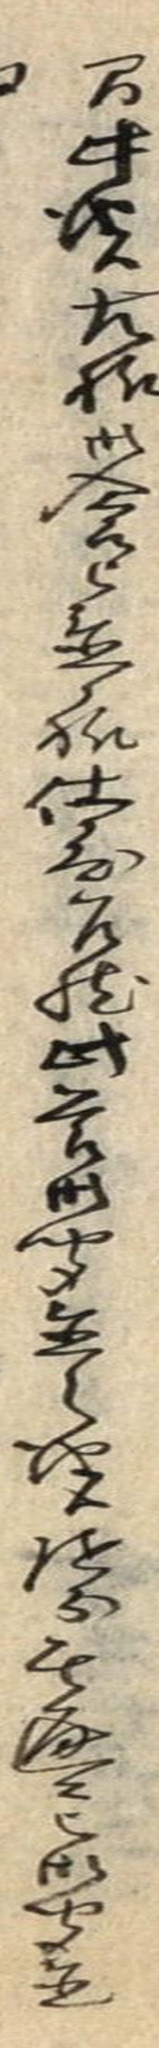間此儀は左様御含被置候様仕度乍然此節御聞置之儀は随分其通に被御聞置
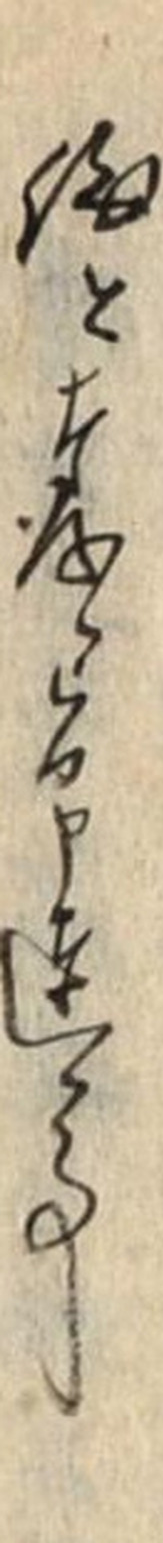儀と奉存候旨申達候事
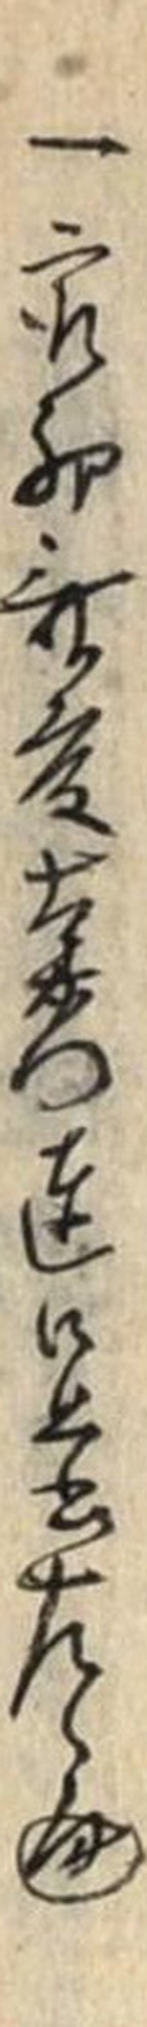一最初齋藤太右衛門達口上書左之通
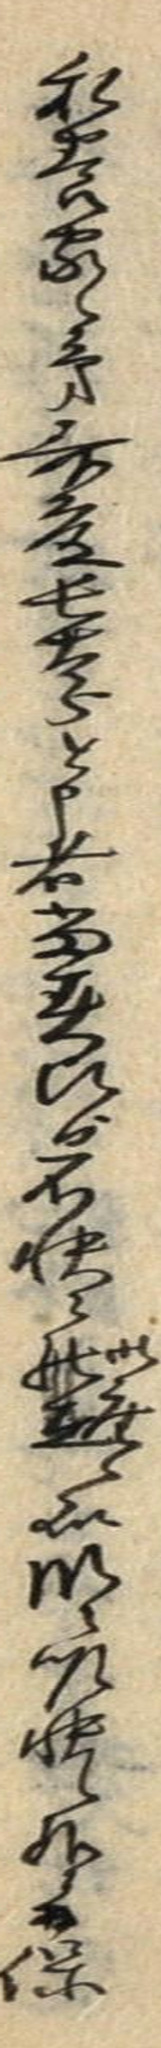私養家之弟齋藤長太郎と申者当春比ゟ不快に御座候処段々順快之外にて保
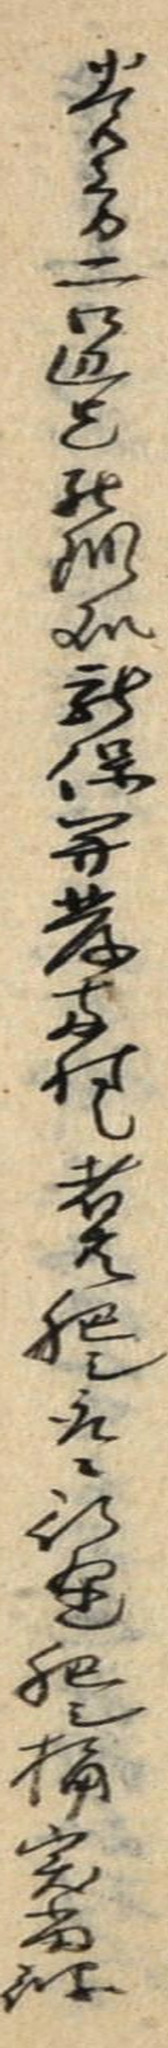養方二口辺迄罷越候処新保開発両村之者共肥シ取に行逢肥シ桶突当彼

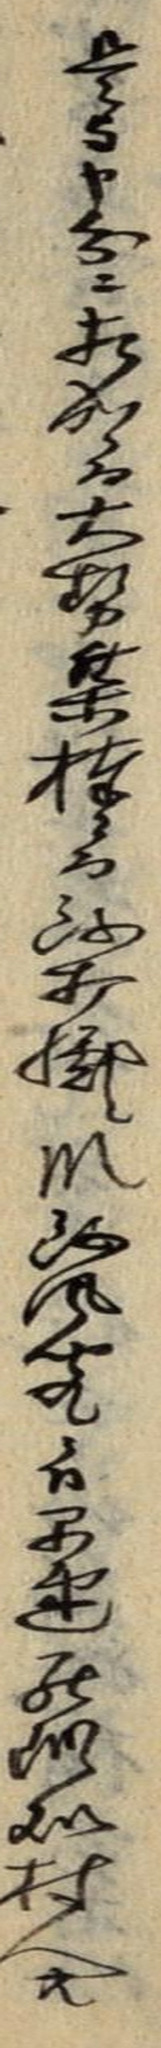是と申分に相成候て大勢集棒にて致打擲候段致風聞候に付早速罷越候処村人共
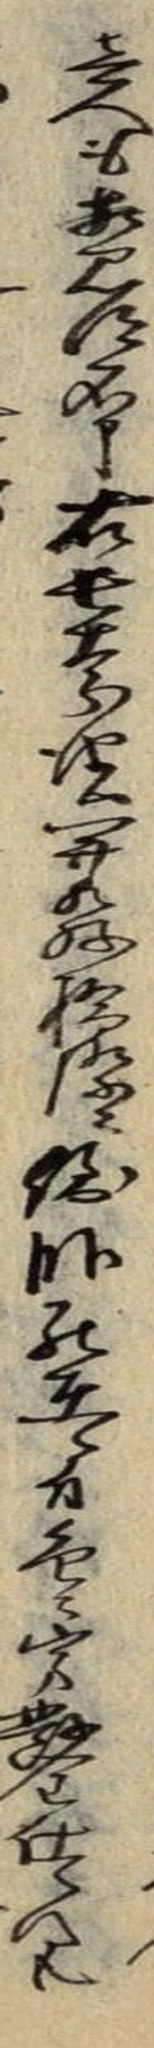壱人も相見得不申右長太郎儀は開発橋際に倒臥罷在候に付色々穿鑿仕候得共
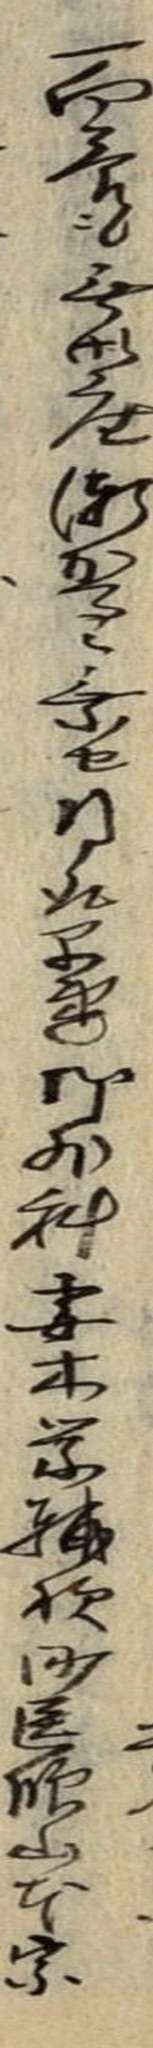一向答も無御座漸駕に乗セ引取早速御外科妻木栄輔様町医師山本宗
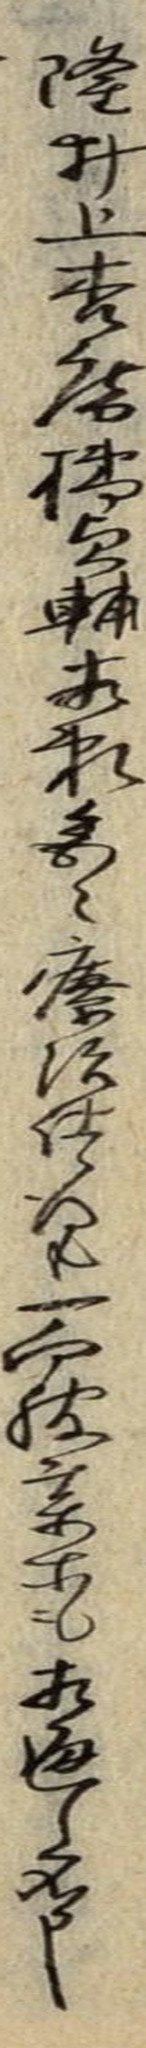隆井上杏庵橘貞輔相頼色々療治仕候得共一向服薬等も相通し不申
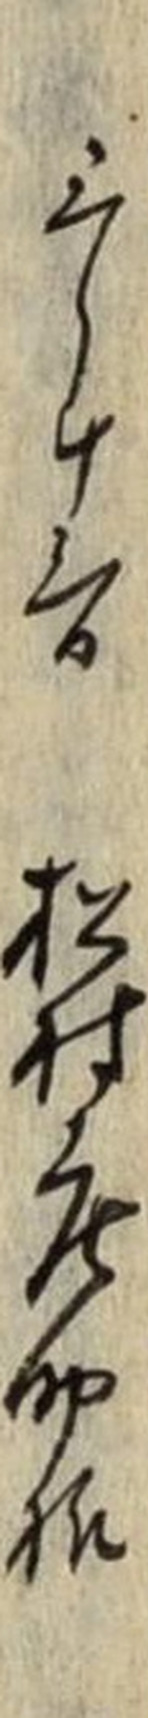三月十三日松村庄助様
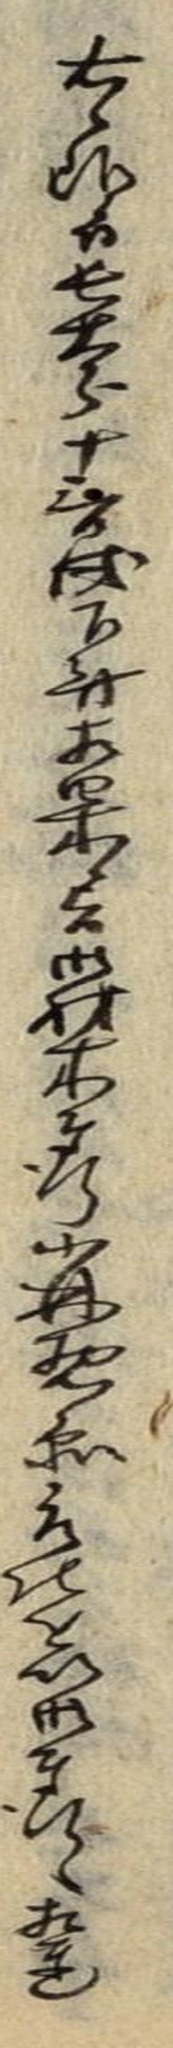右之趣に付長太郎十三日戌下刻相果候旨御材木奉行小林惣兵衛取次を以御奉行へ相達
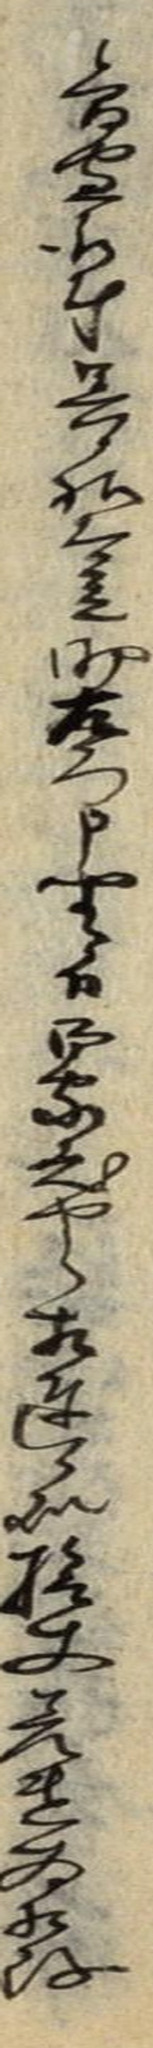候間宜取斗呉候様今立助左衛門申聞候に付御家老中へ相達候処検使差遣為相改
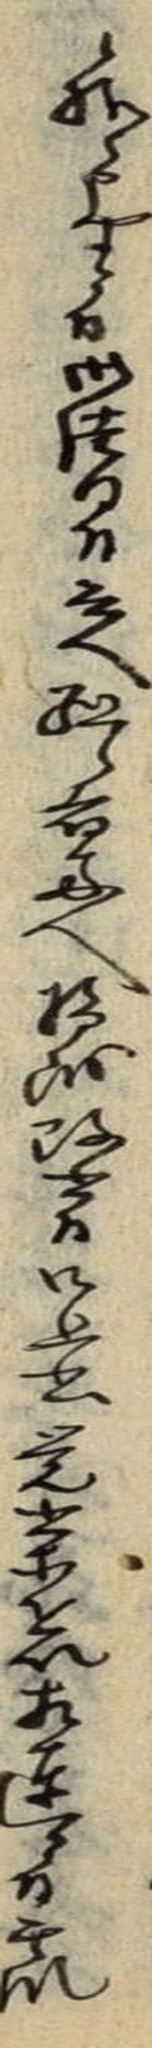候様被申聞候に付御徒目付壱人組之者両人指越改書付口上書覚書等を以相達候に付其段
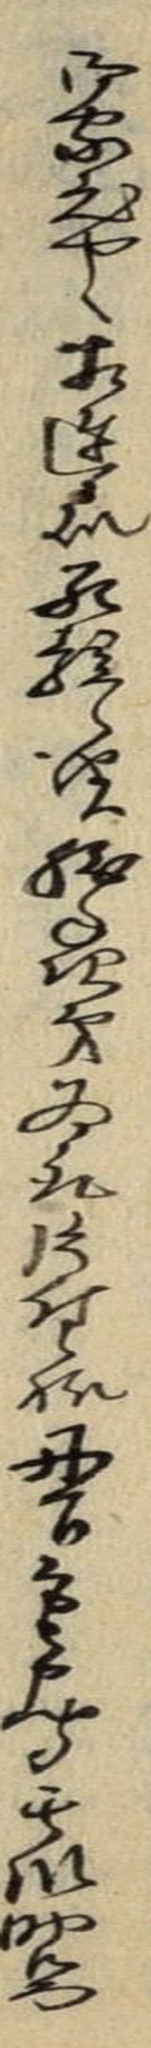御家老中へ相達候処死骸之儀は勝手次第為取片付候様丹下方被申聞其段助左衛門
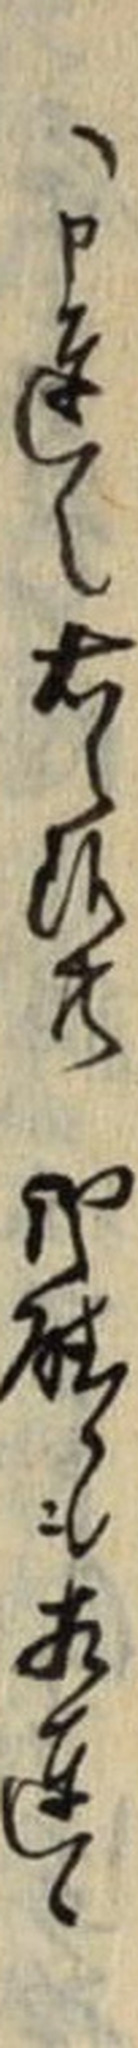へ申達之右之趣共御聴へも相達候
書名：御停止異変死失
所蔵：福井県文書館 Fukui Prefectural Archives
